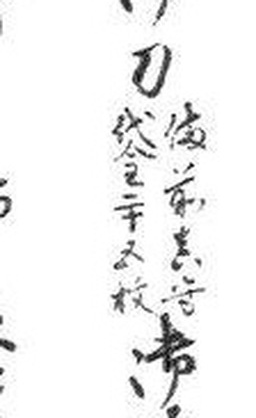代金三十枚
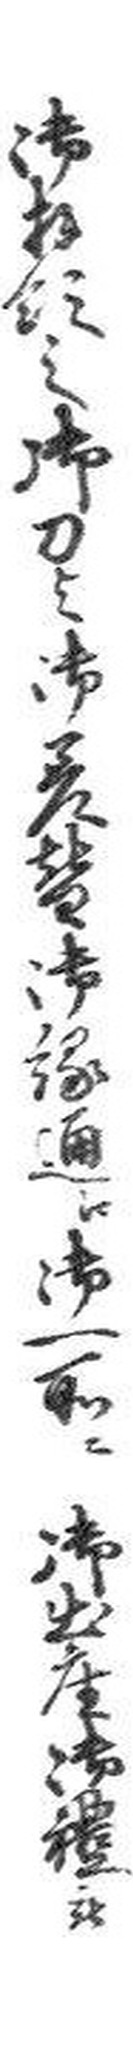御拝領之御刀与御差替御縁通江御一所ニ御出座御礼被
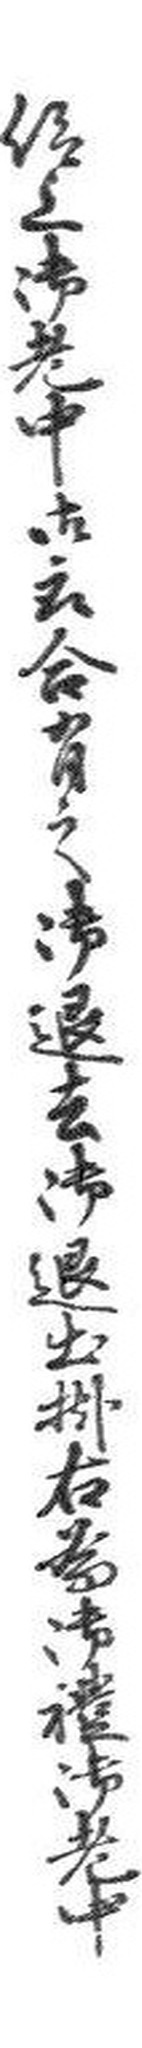仰上御老中御取合有之御退去御退出掛右為御礼御老中
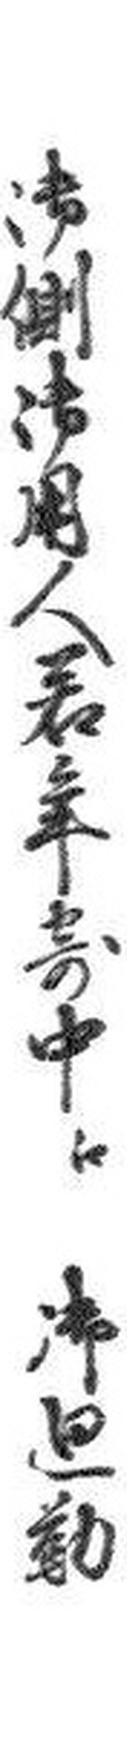御側御用人若年寄中江御廻勤
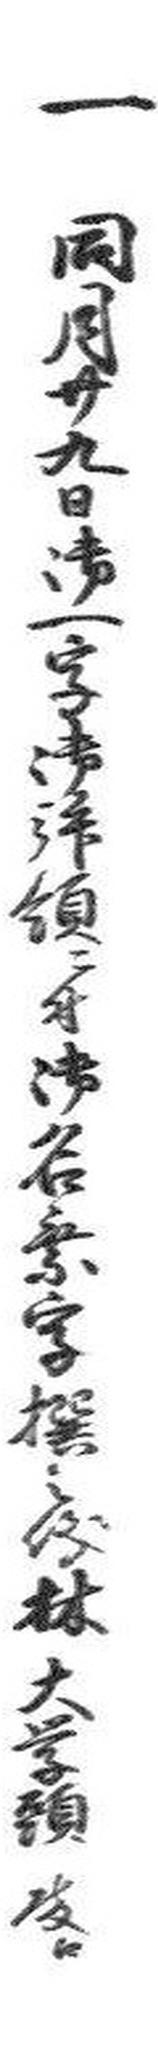一同月廿九日御一字御拝領ニ付御名乗字撰之儀林大学頭殿江
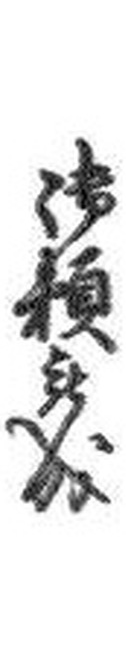御頼被成
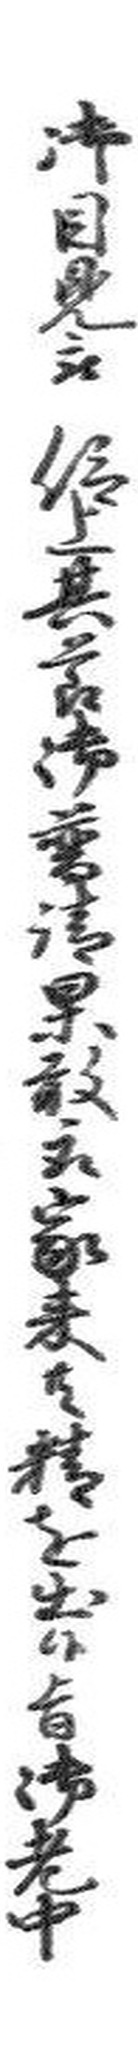御目見被仰上其節御普請果敢取家来共精を出候旨御老中
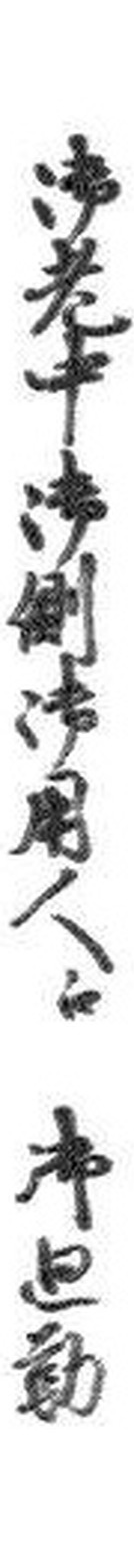御老中御側御用人江御廻勤

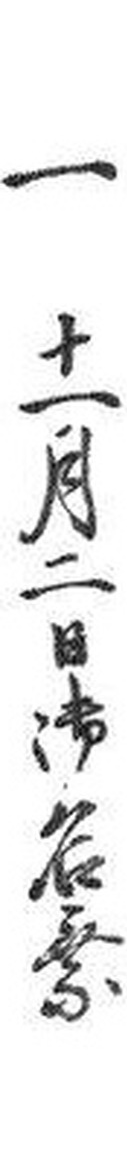一十一月二日御名乗
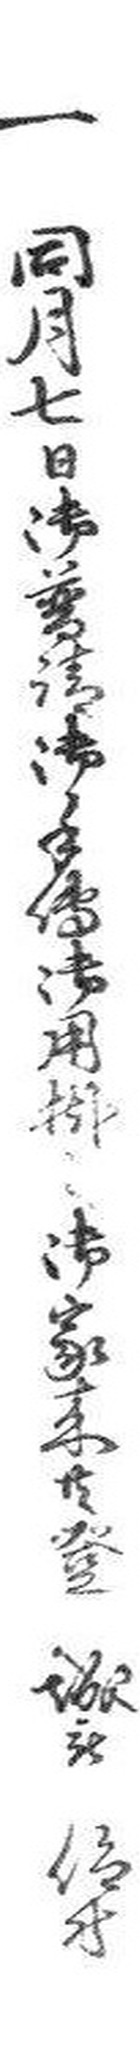一同月七日普請御手伝御用掛之御家来共登城被仰付
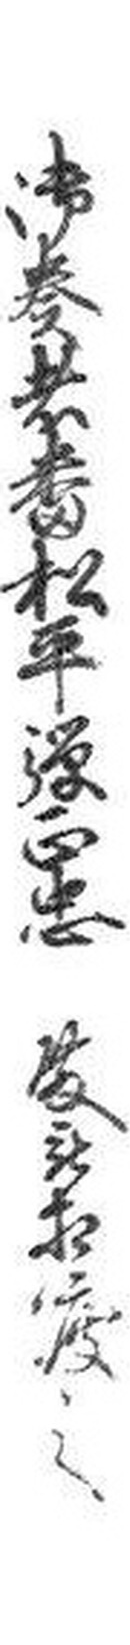御奏者番松平弾正忠殿被相渡之
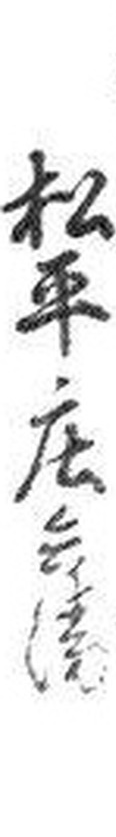松平庄兵衛
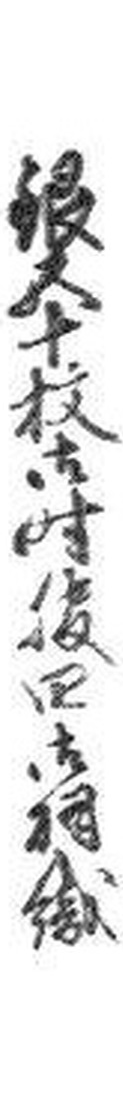銀五十枚御時服四御羽織副奉行
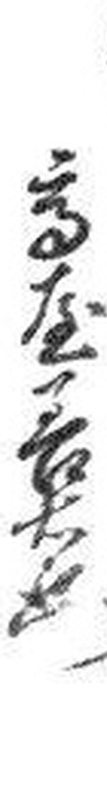高屋善右衛門
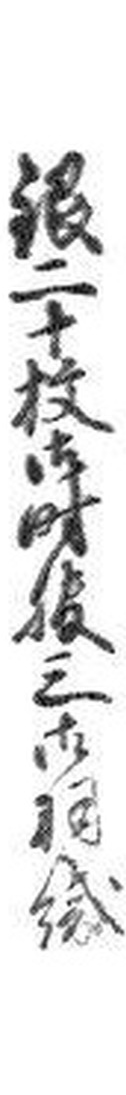銀二十枚御時服三御羽織御用人
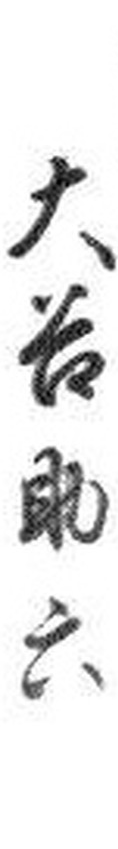大谷助六
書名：家譜 二十三 吉品公 従宝永元年到同二年
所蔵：福井県文書館 Fukui Prefectural Archives
